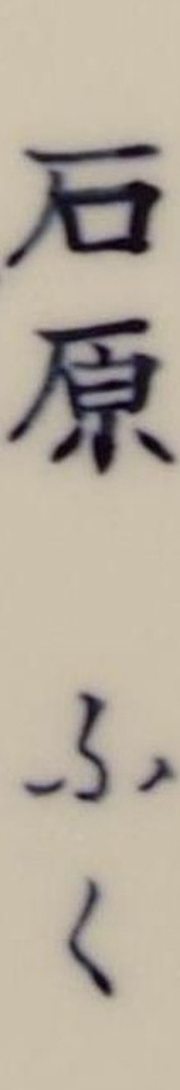石原ふく
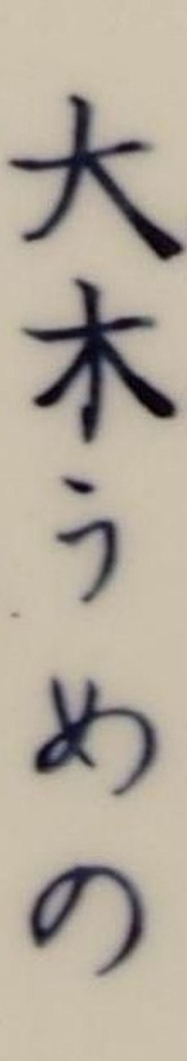大木うめの
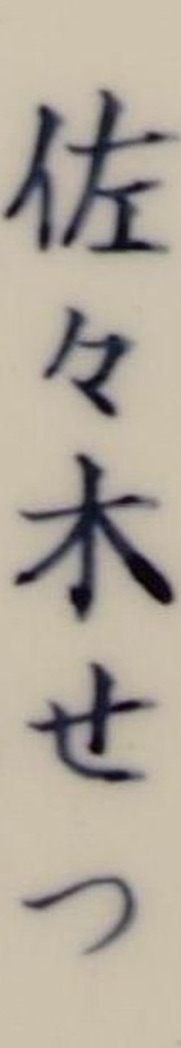佐々木せつ
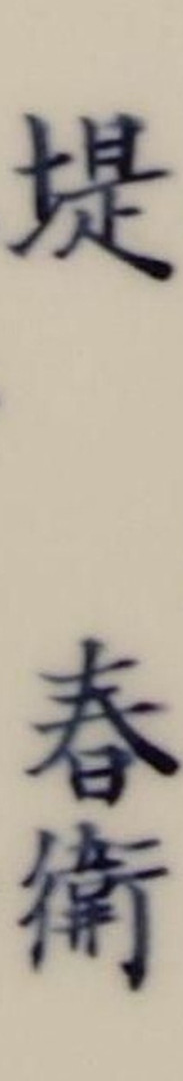堤春衛
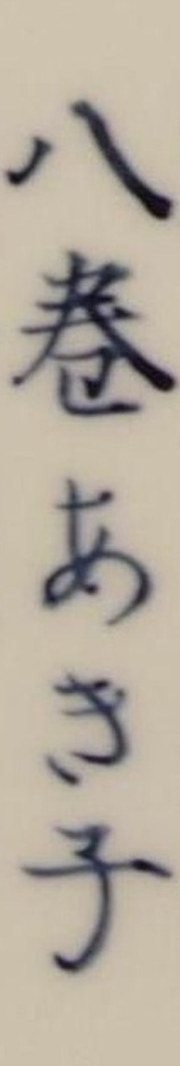八巻あき子
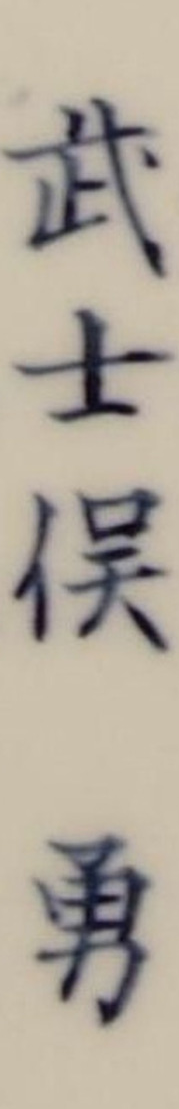武士俣勇
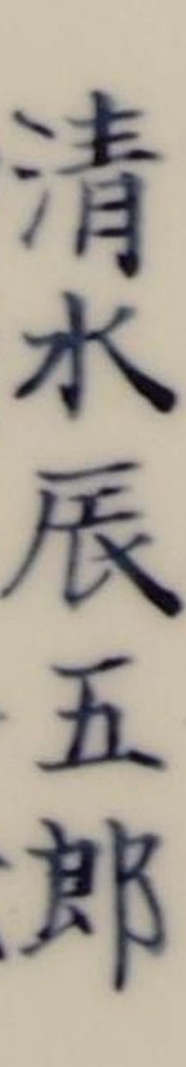清水辰五郎
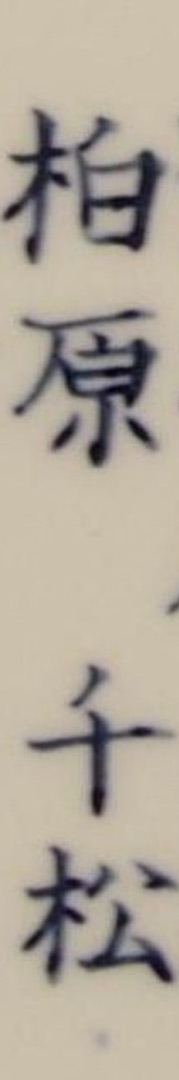柏原千松
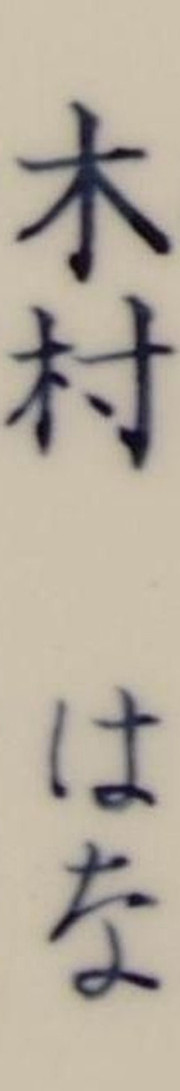木村はな
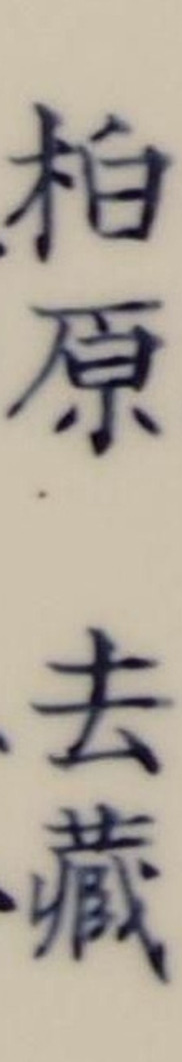柏原去蔵
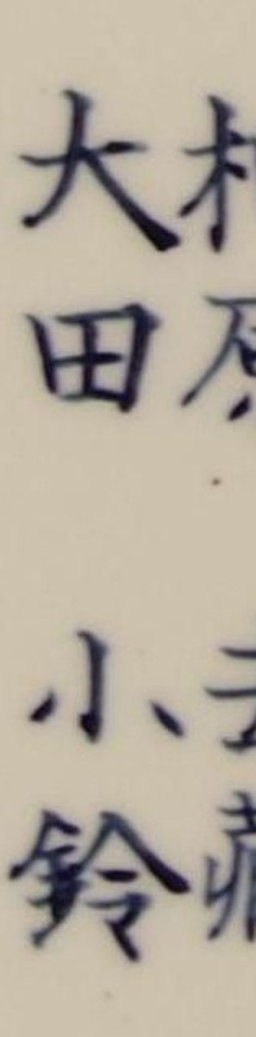大田小鈴
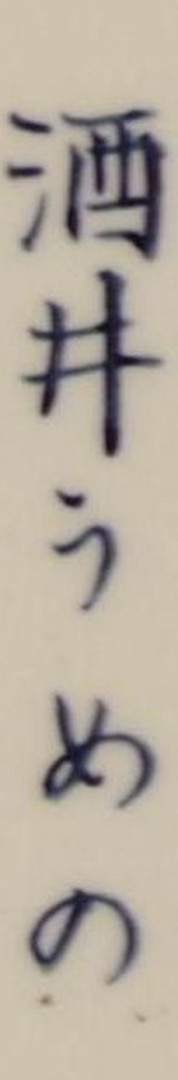酒井うめの
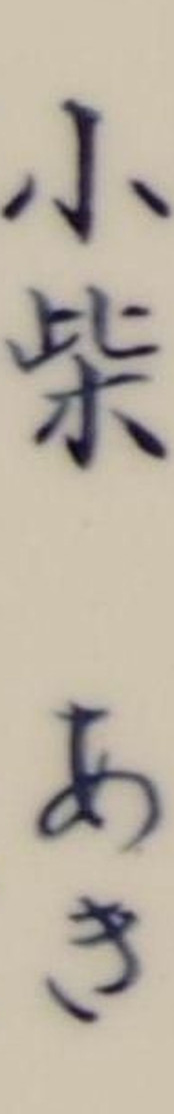小柴あき
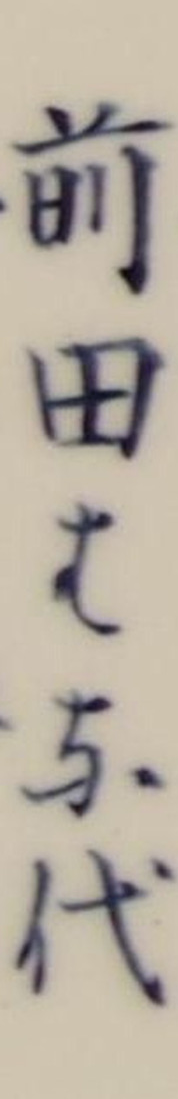前田はな代
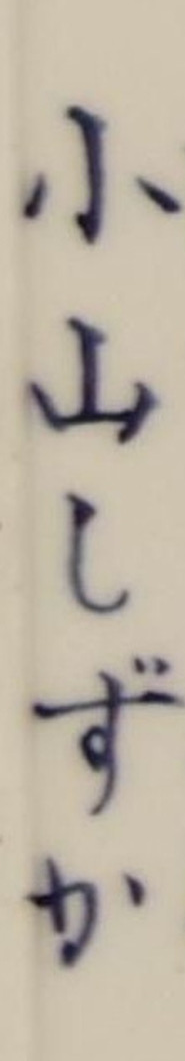小山しずか

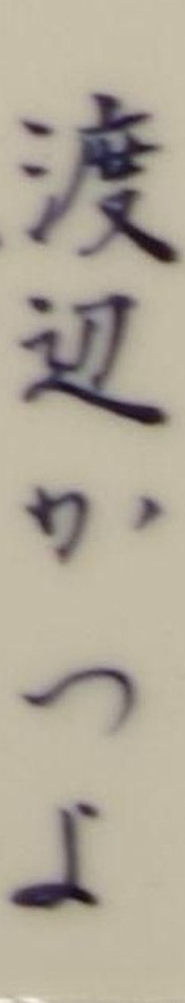渡辺かつよ
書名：M~S
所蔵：高野山金剛峯寺
